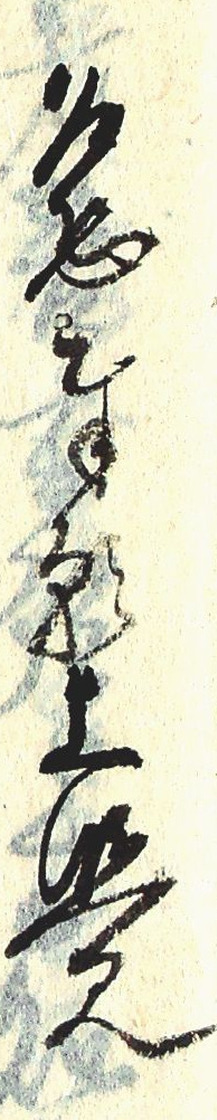乍恐奉願上覚
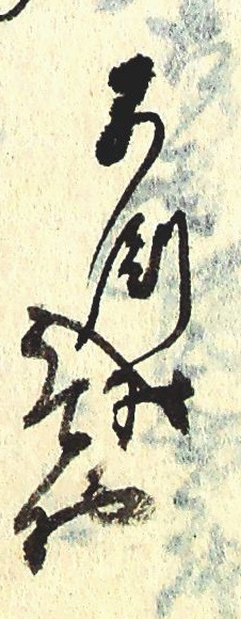早淵村
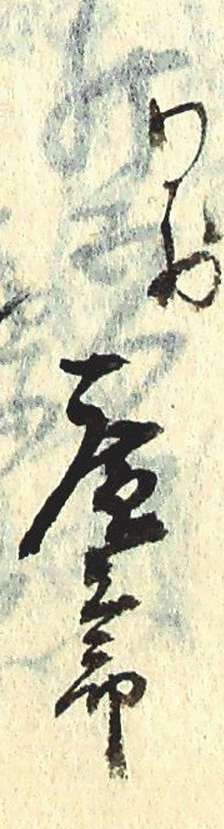同村広三郎
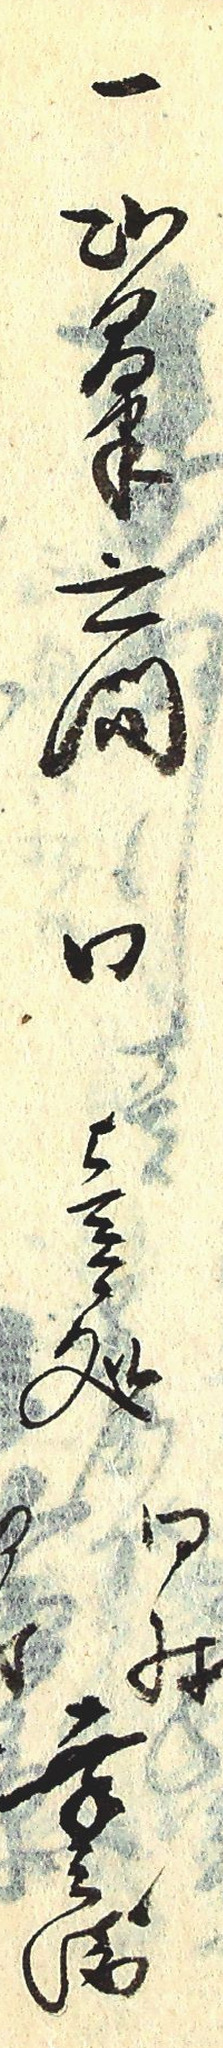一弐間半六間同壱処幸兵衛
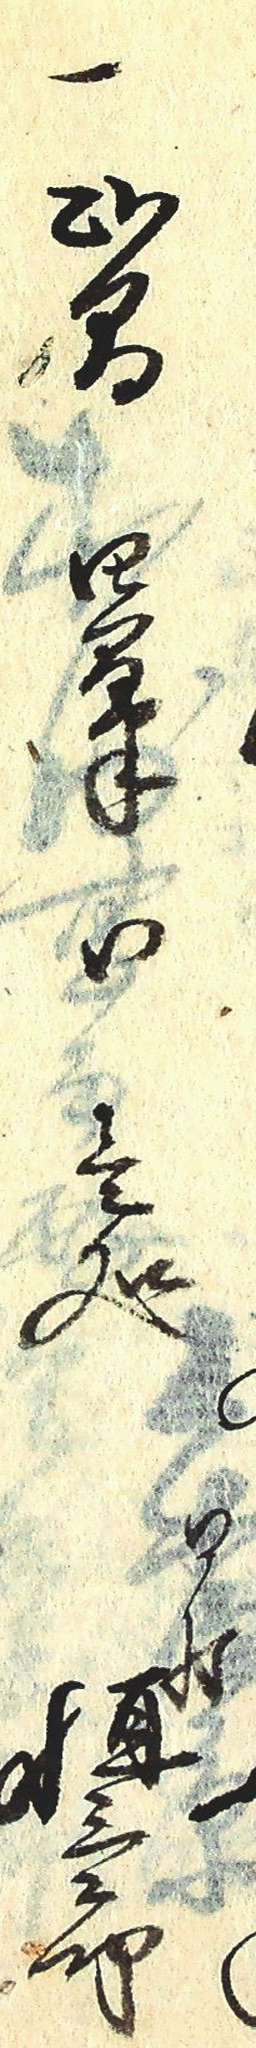一弐間四間半同壱処恒三郎
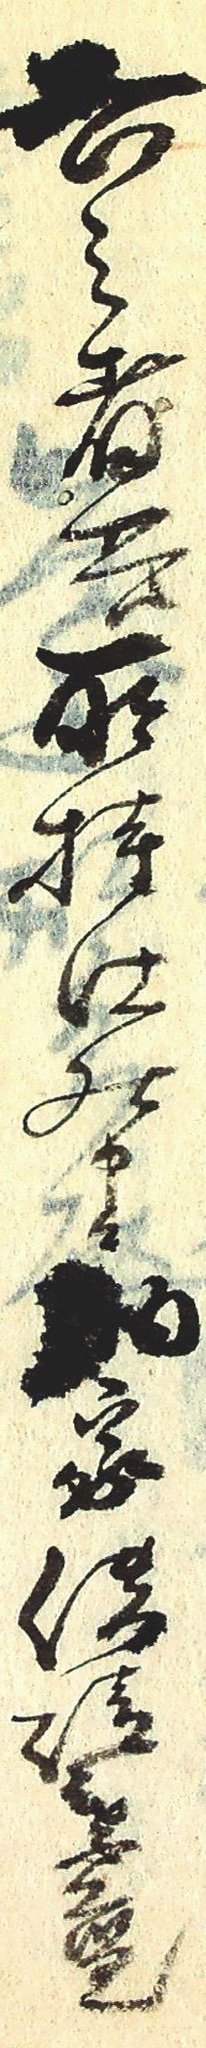右之者共所持仕居申候納家借請葉藍
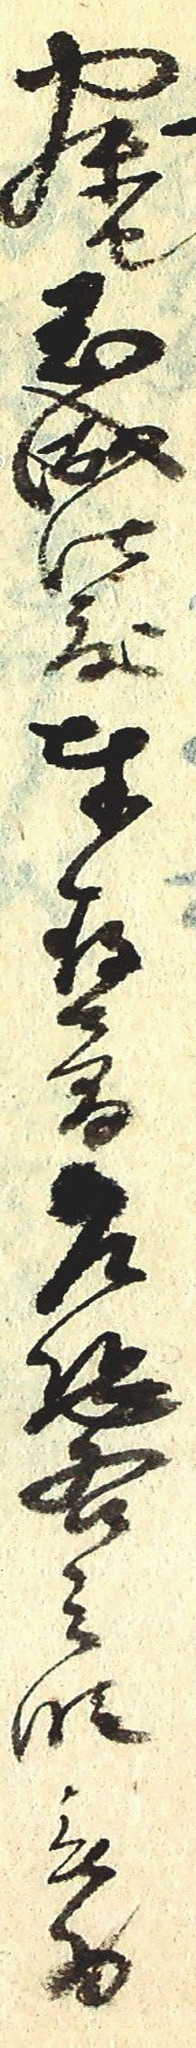寐せ玉成仕度奉存候間乍恐右之段被為
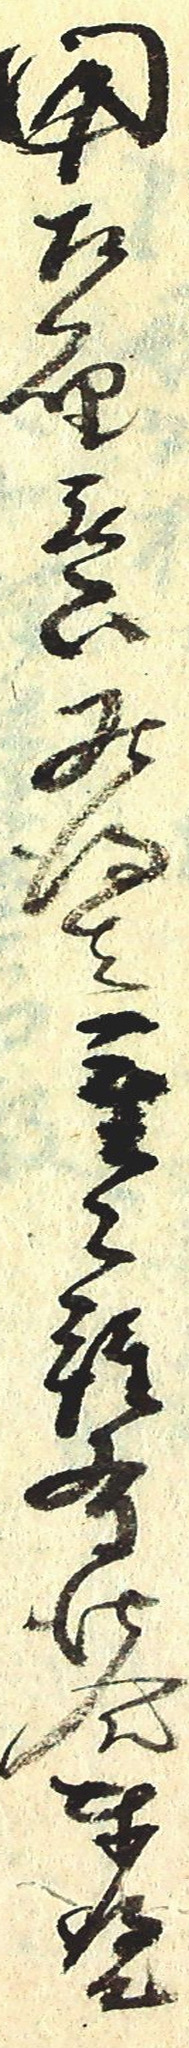聞召届被下候得は重々難有仕合奉存候
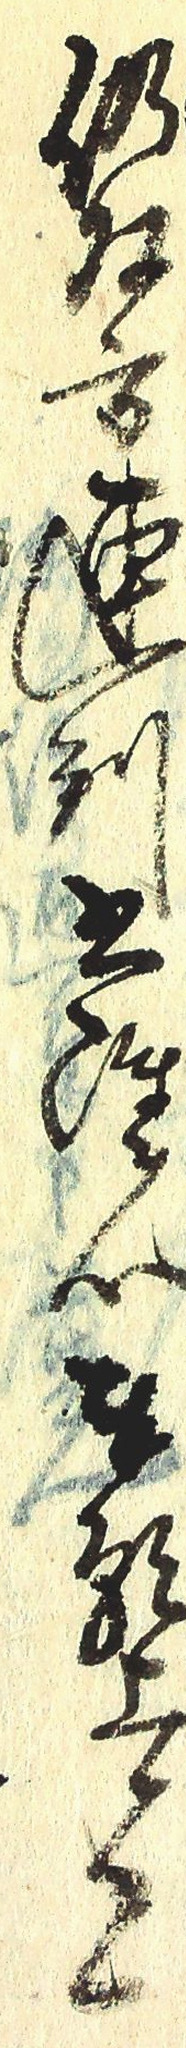仍双方連判書附を以奉願上候以上
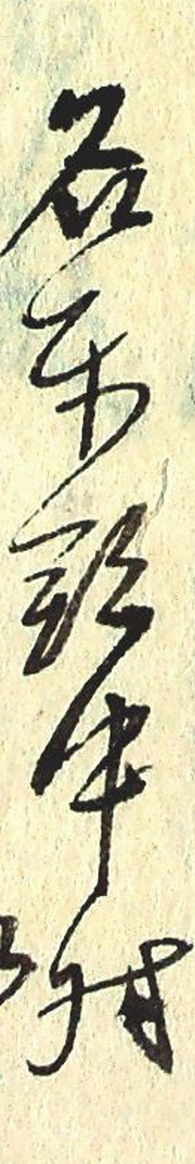名東郡中村
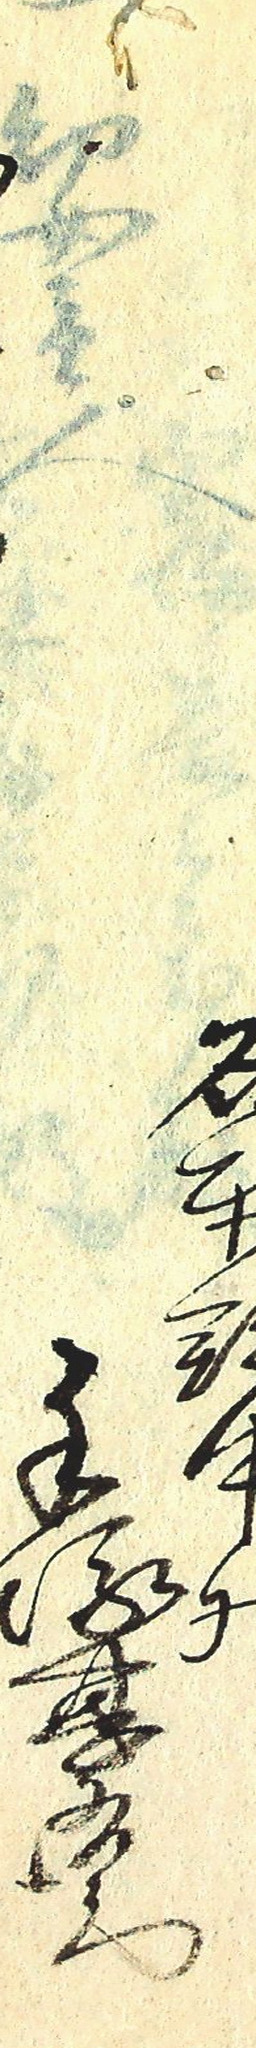手塚甚右衛門
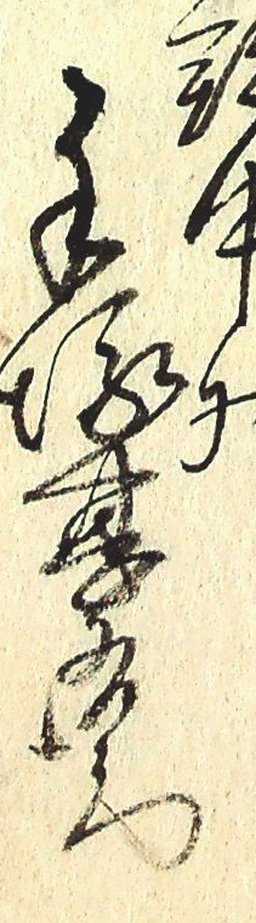手塚甚右衛門
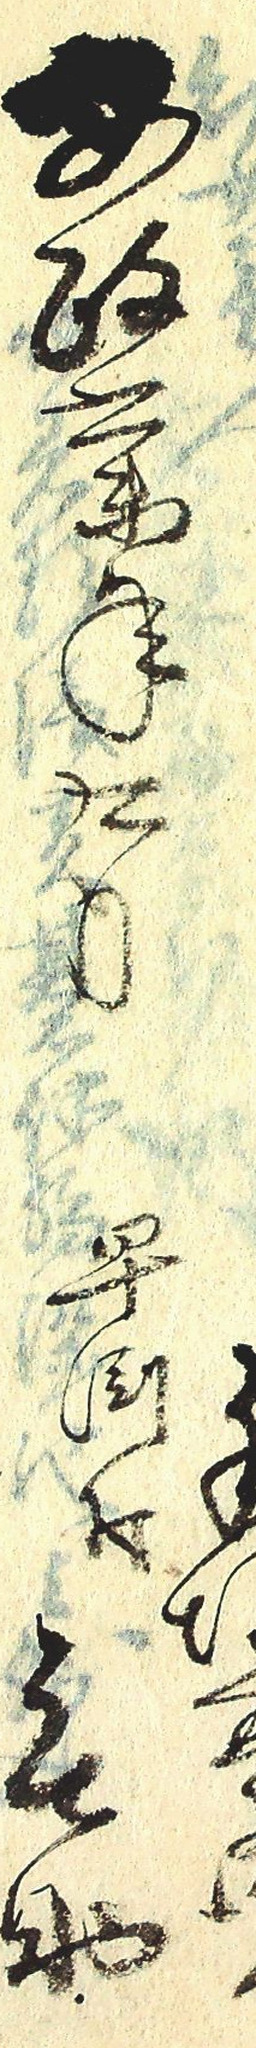安政六未年九月早淵村庄助
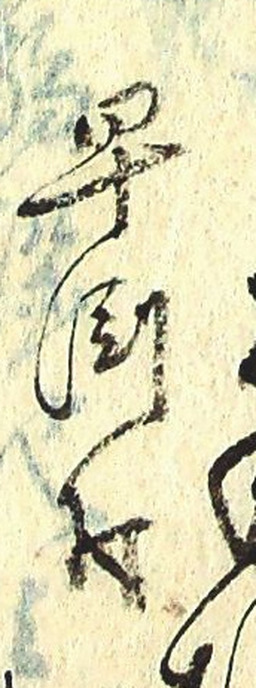早淵村
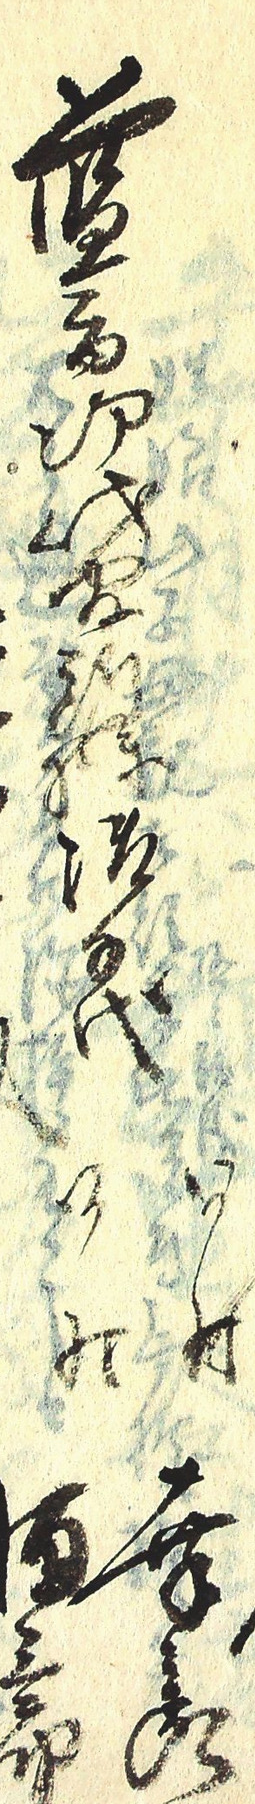藍方御代官所様御手代同村恒三郎
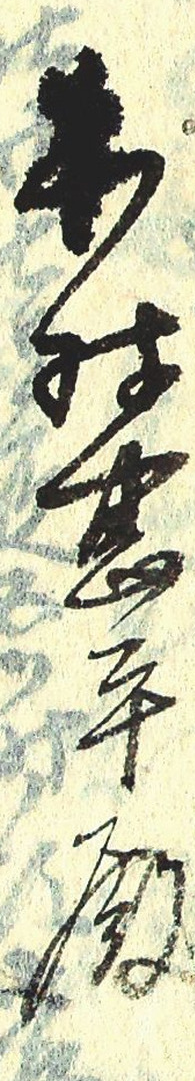木村甚平殿
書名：諸御願書控(弐番）
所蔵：鳴門教育大学 Naruto University of Education
